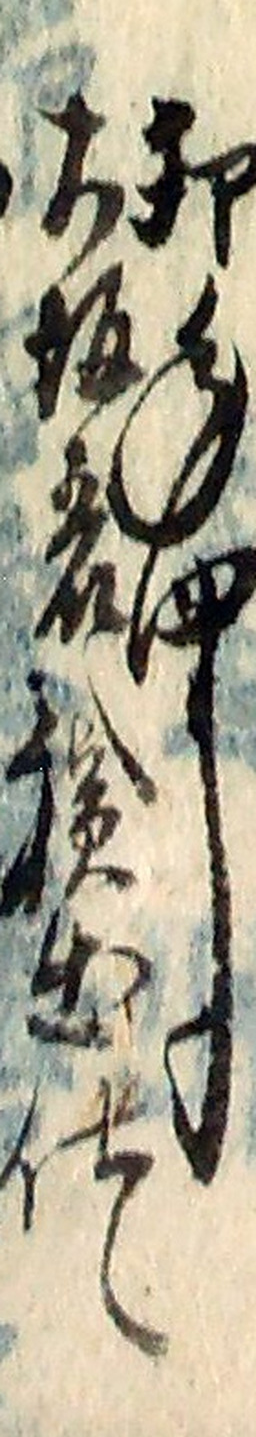大坂表へ積出仕候
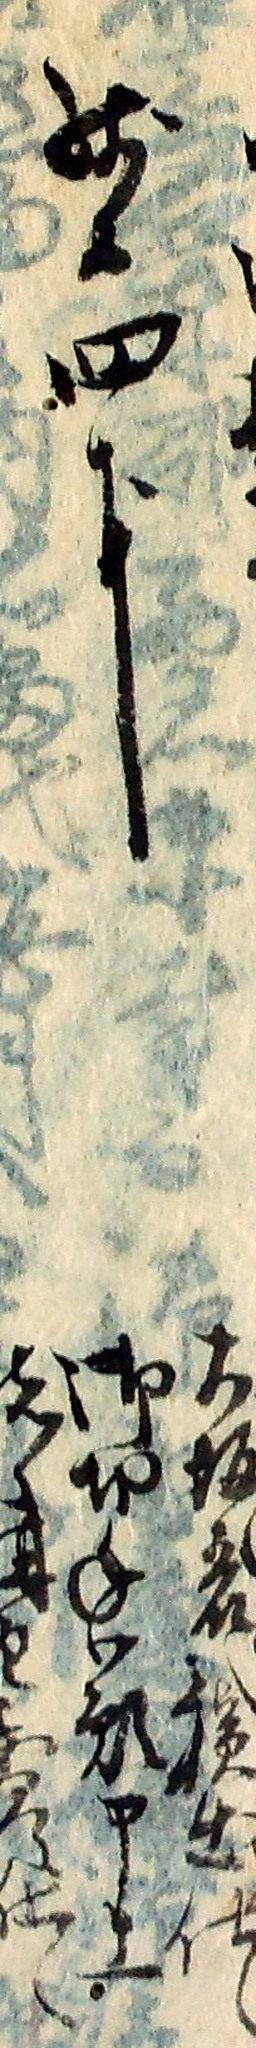残て四本御切手御願申上
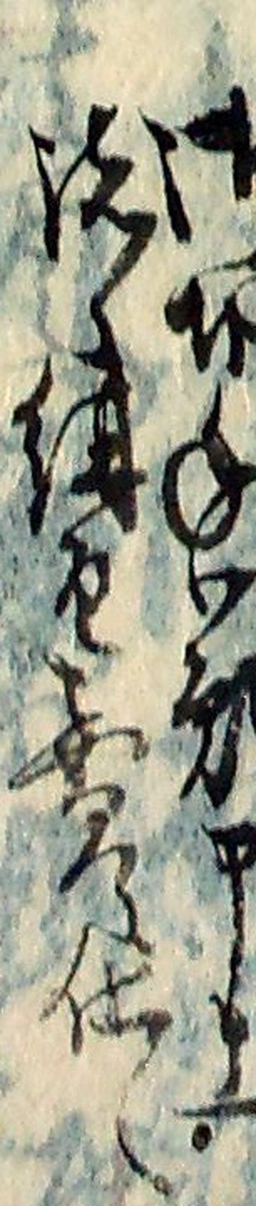諸々紺屋売に仕候
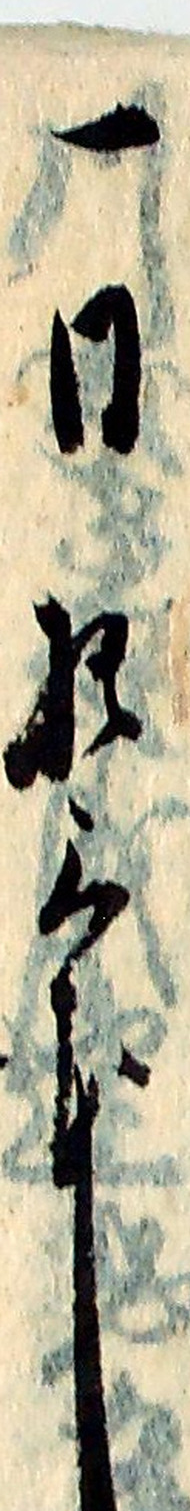一同拾三本
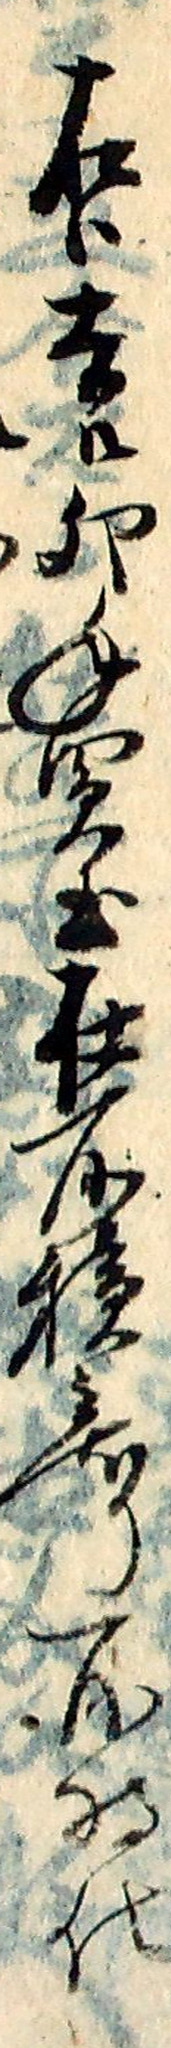右は去る卯年買玉在所積戻り所持仕
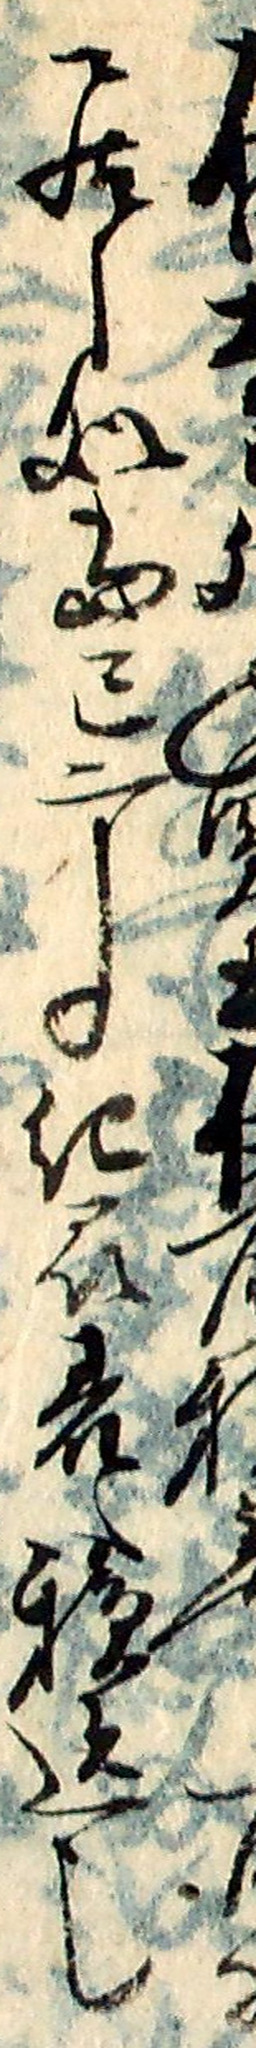居申候処当巳二月紀州表へ積送申候
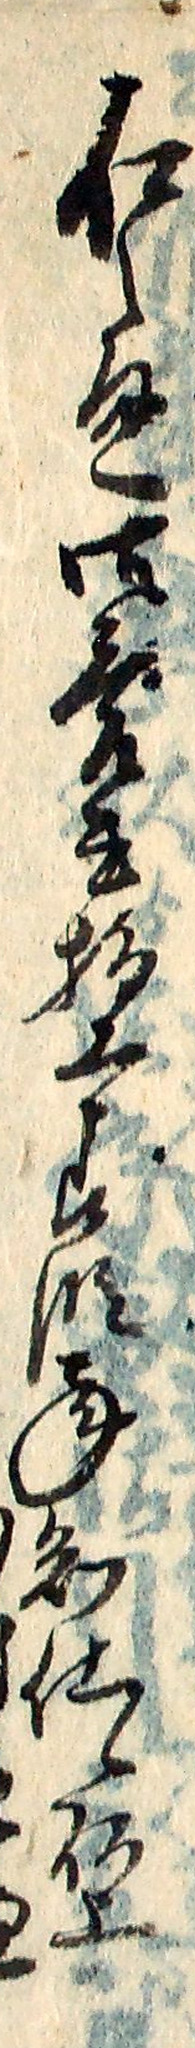右之通御答書指上申候段承知仕候以上
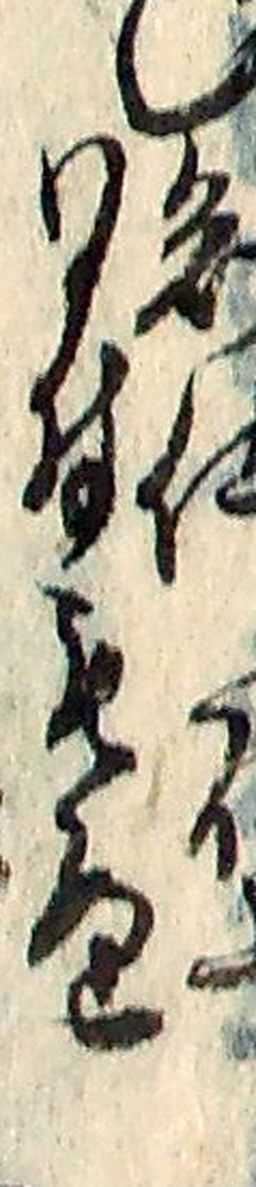同村庄屋

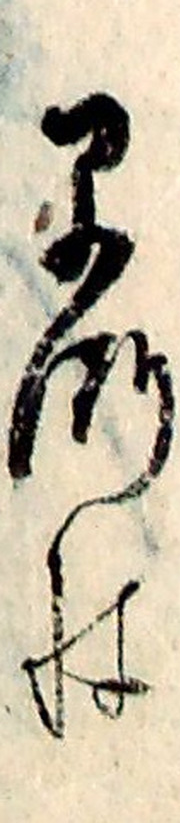早淵村
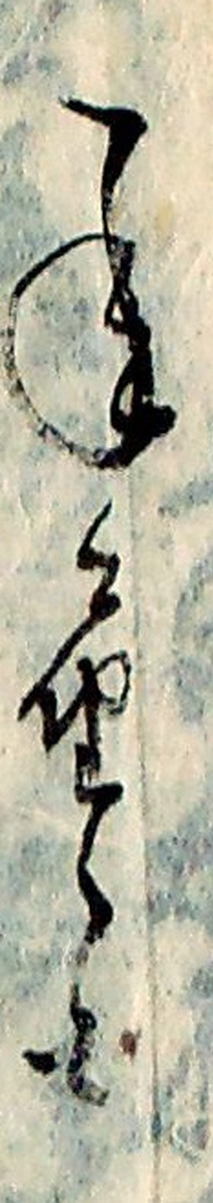承届候以上
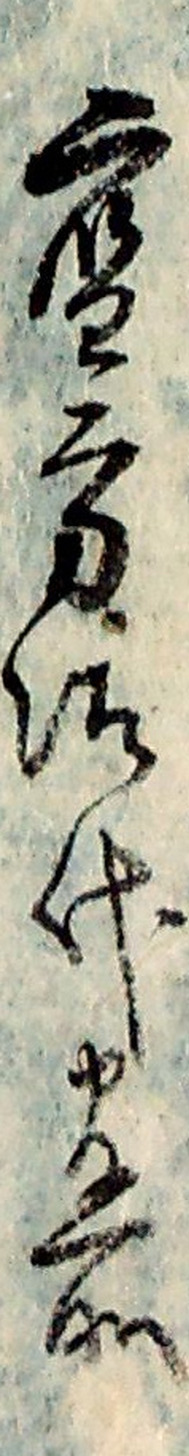藍方御代官所
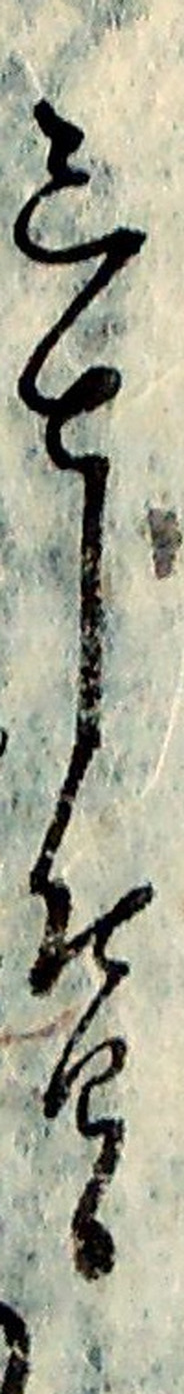巳七月廿四日
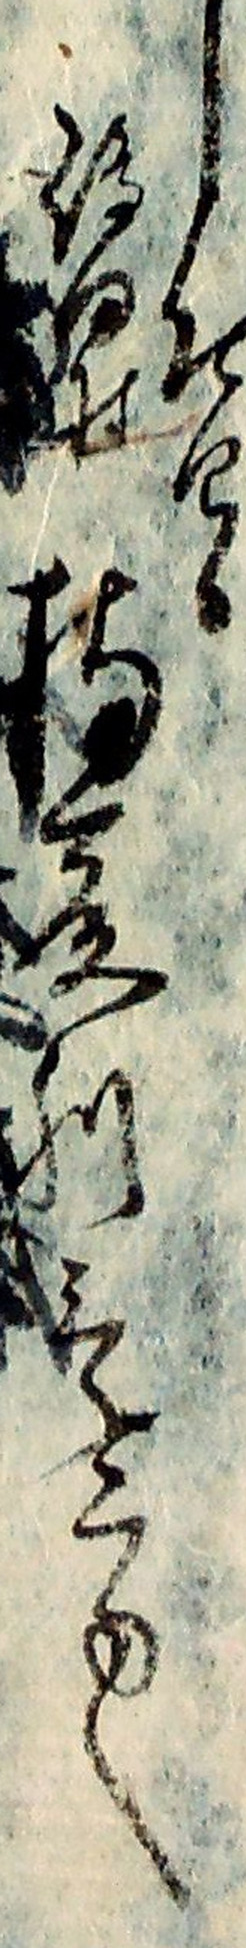島田村橋藤利三郎方へ
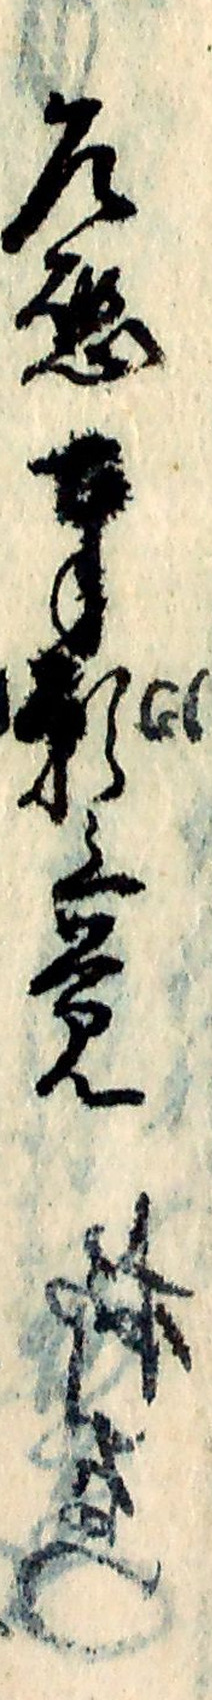乍恐奉願上覚
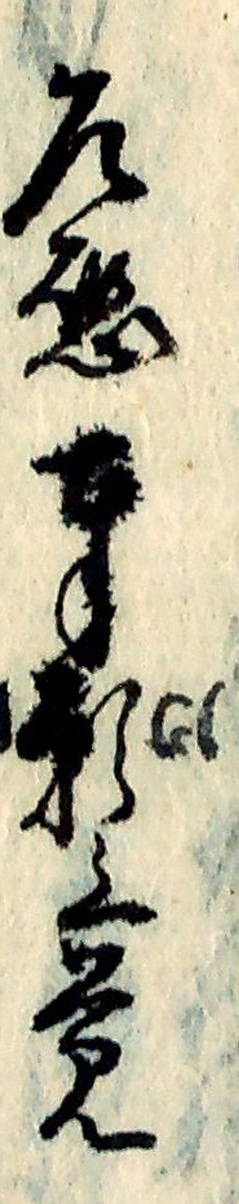乍恐奉願上覚
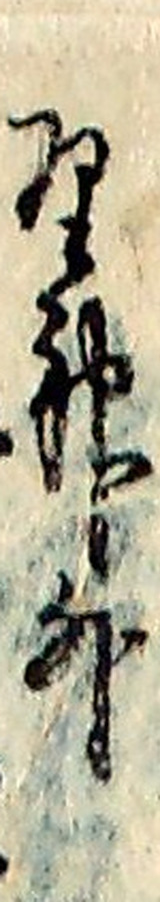野神外
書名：諸御願書控(後藤氏壱番）
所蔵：鳴門教育大学 Naruto University of Education
